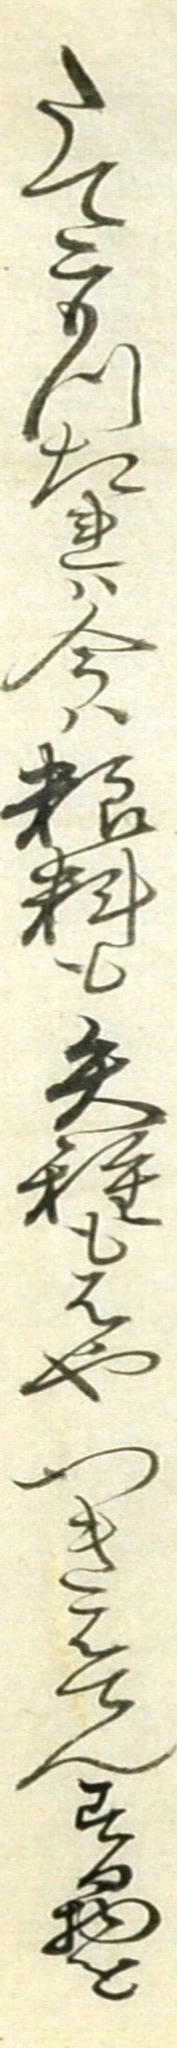たてこもつたれは今は粮料も矢種もはやつきはてんする物を
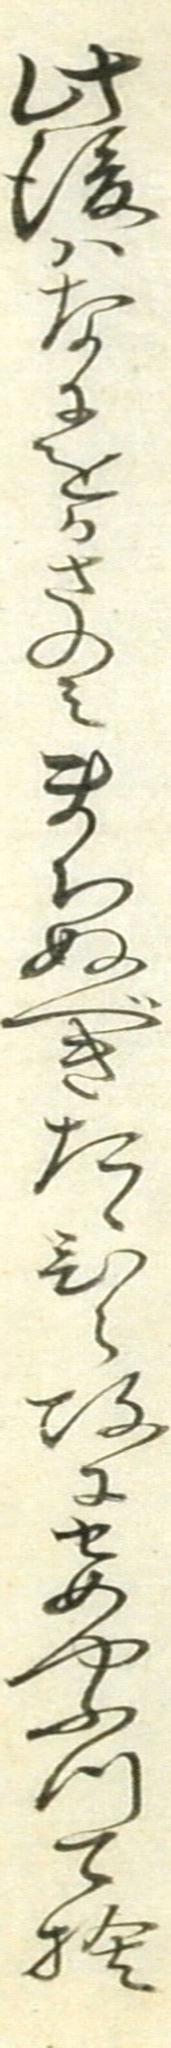此後はなにをかさのみまちぬべきたゝひら攻にせめやふつて捨
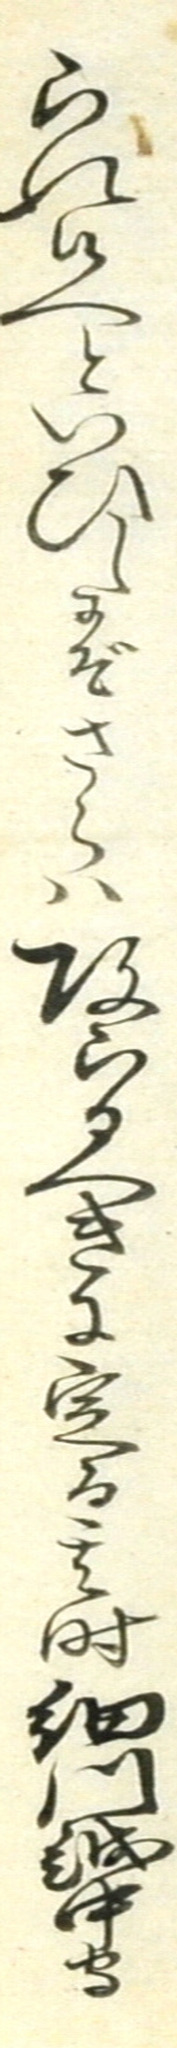られ候へといひしにぞさらは攻らるへきに定る其時細川越中守
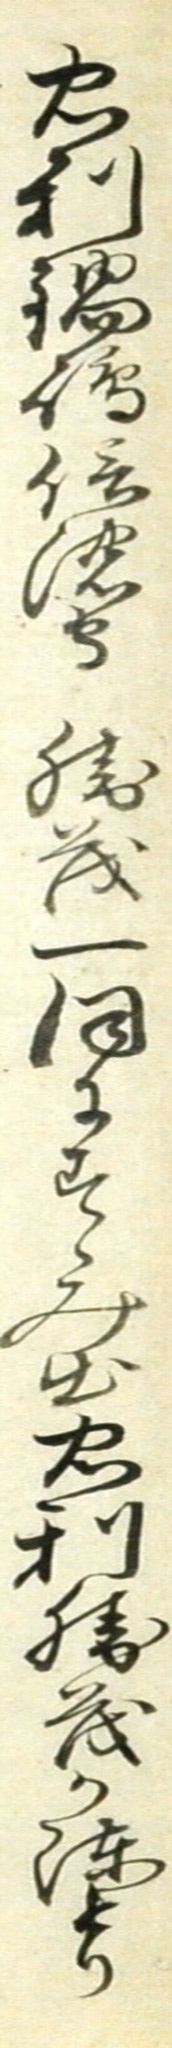忠利鍋島信濃守勝茂一同にすゝみ出忠利勝茂か陣とり
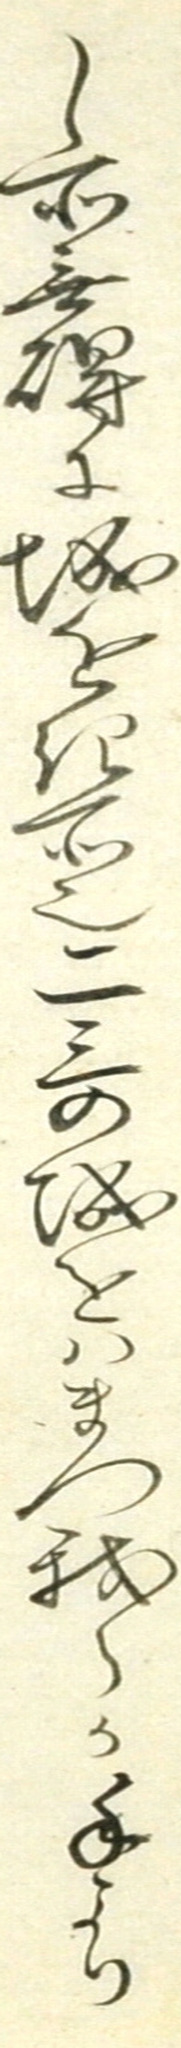し所無碍に城をき所也二三の城をはまつ我らか手より
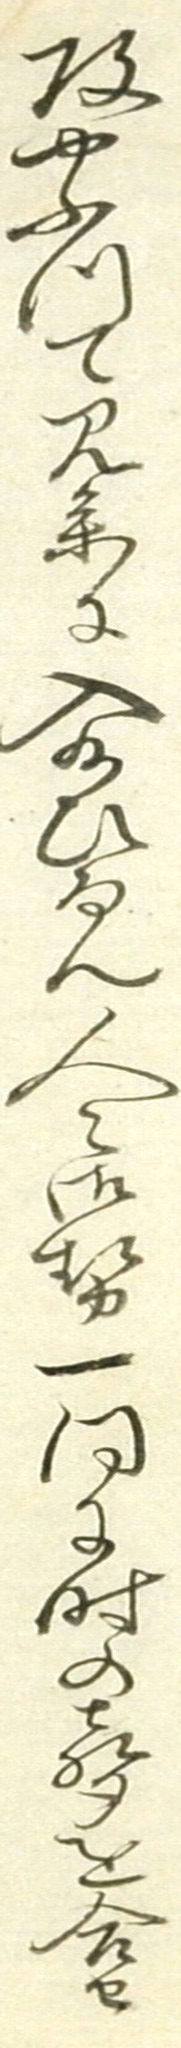攻やふつて見参に入給ひなん人々御勢一同に時の声を合せ
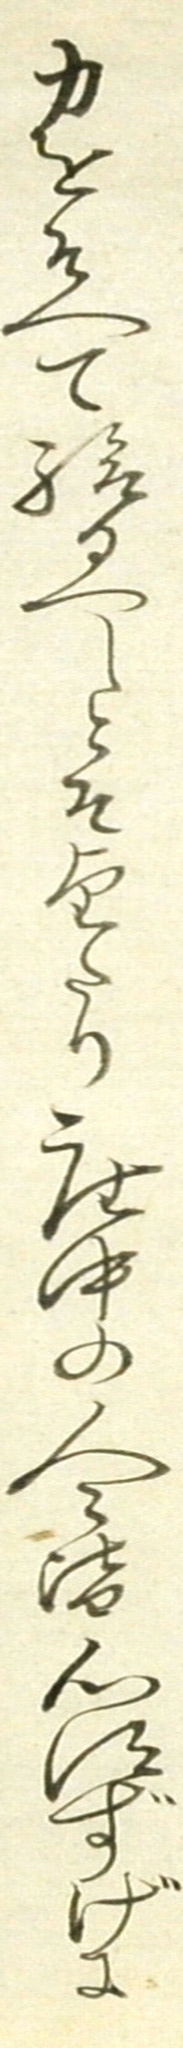力をそへて給るへしとそ望たり座中の人々皆心得ずげに
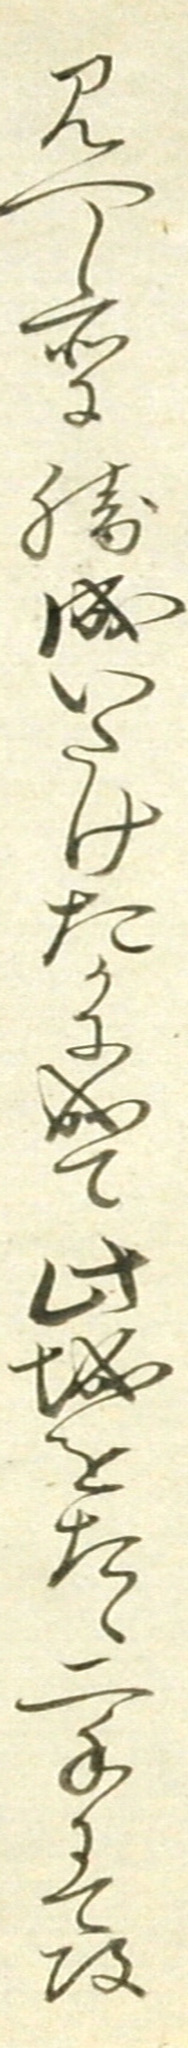見へし所に勝成いたけたかに成て此城をたゝ二手にて攻
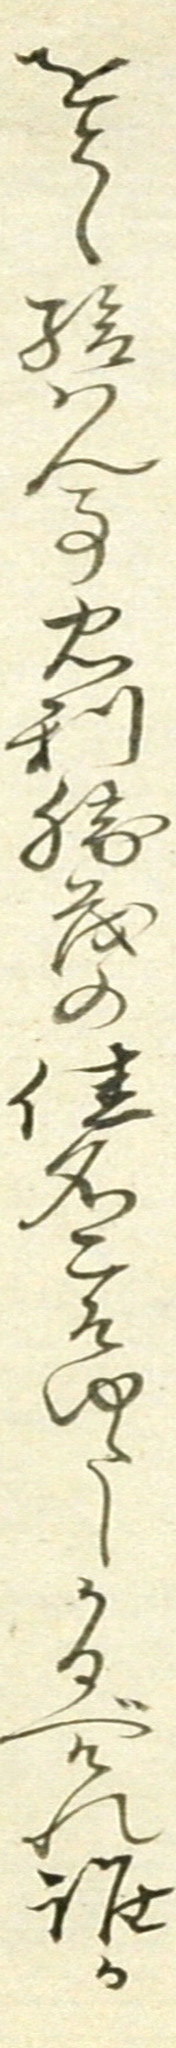をとし給はん事忠利勝茂の佳名こそゆゝしかるべけれ誰か
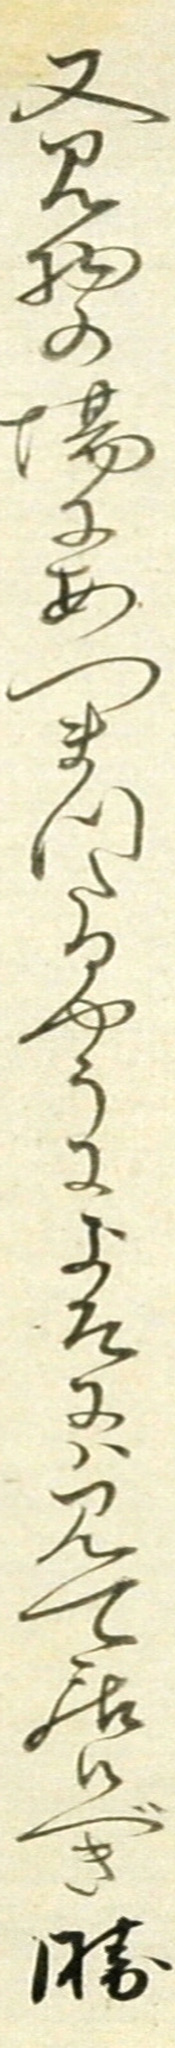又見物の場にあつまつたるやうによそには見て居候べき勝
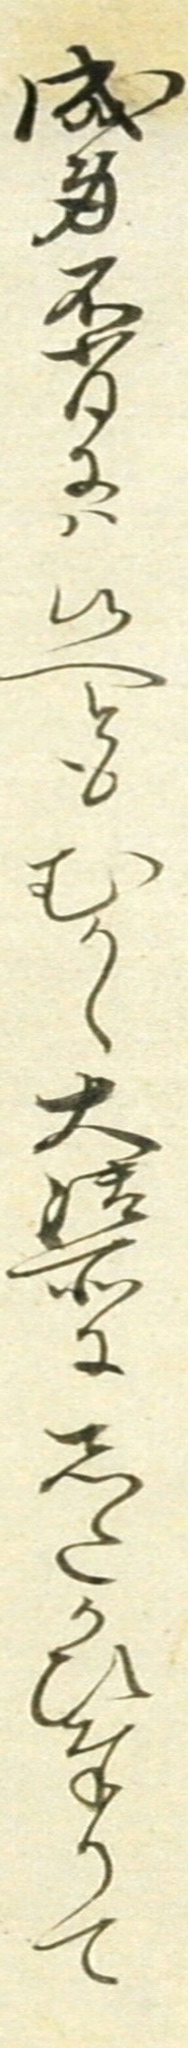成身不肖には候へともむかし大御所にしたかひ奉りて
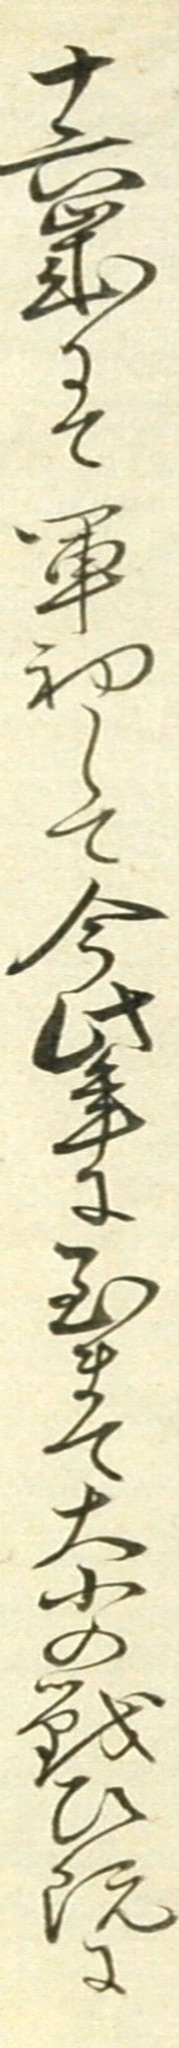十六歳にて軍初して今此年に至まて大小の戦ひ既に
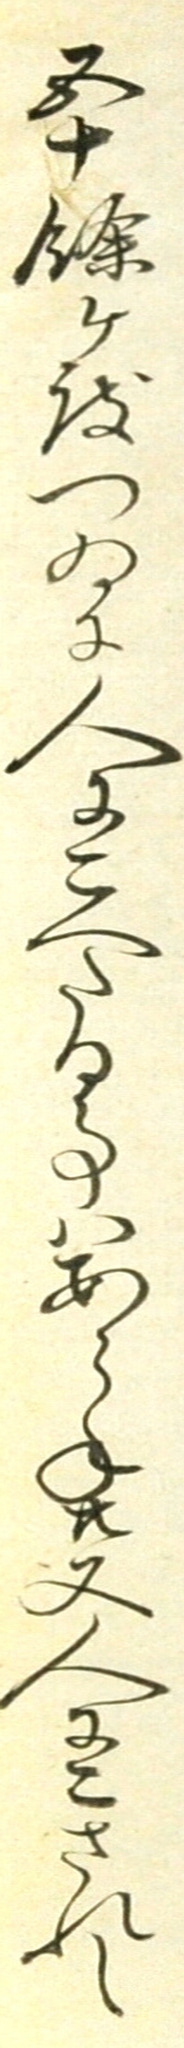五十余ヶ度つゐに人にこへたる事はあらね共又人にこされし

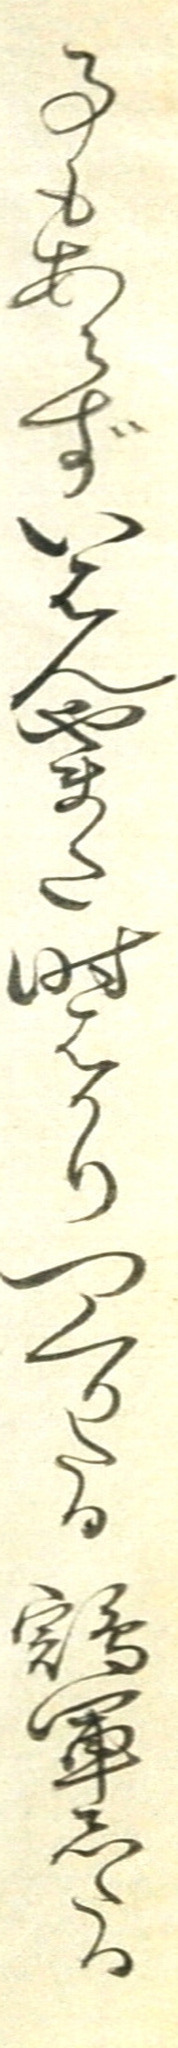事もあらずいはんやまた時はかりつくりたる雞軍したる
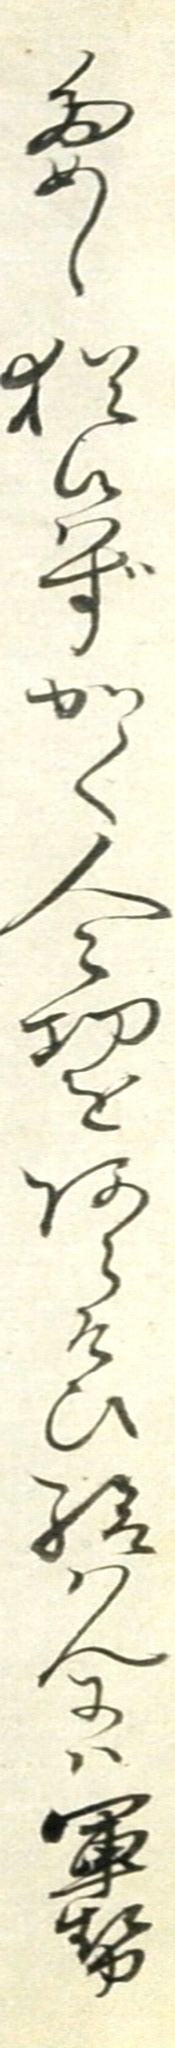ためし猶候はずかく人々功をあらそひ給はんには軍勢
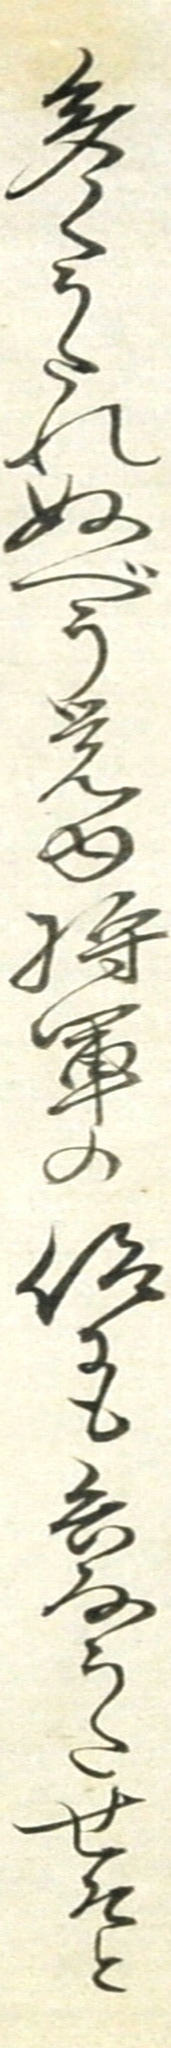多くうたれぬべう覚ゆ将軍の仰にも兵なうたせそと
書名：藩翰譜（二・三）
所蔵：伊那市立高遠町図書館・合同会社AMANE
